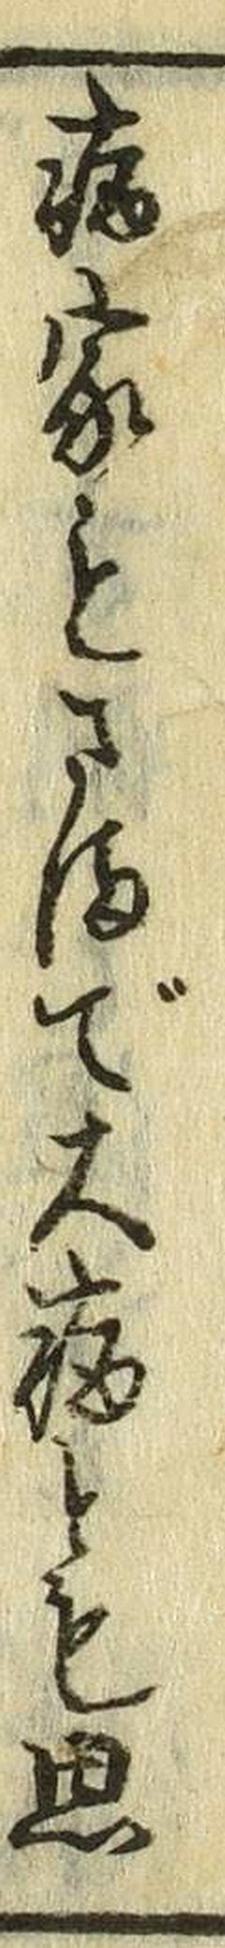病家もさまで大病とも思
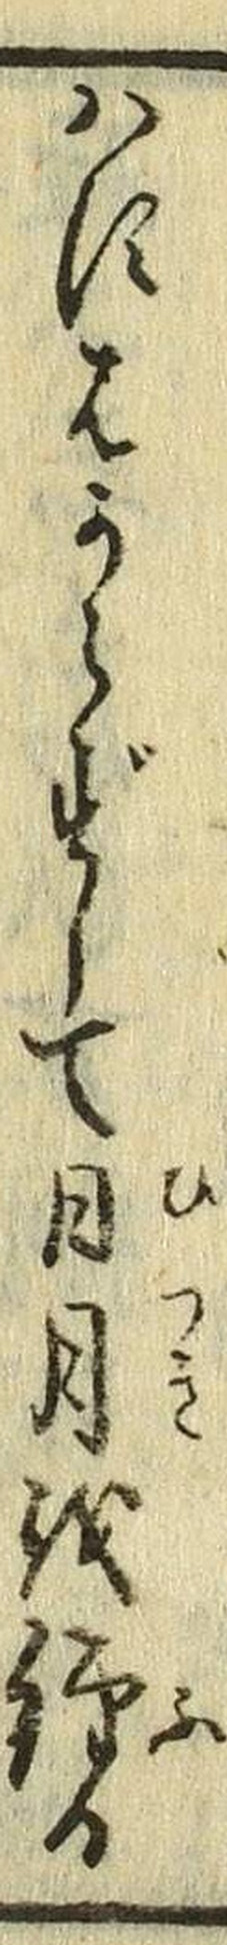はすはからずして日月を経る
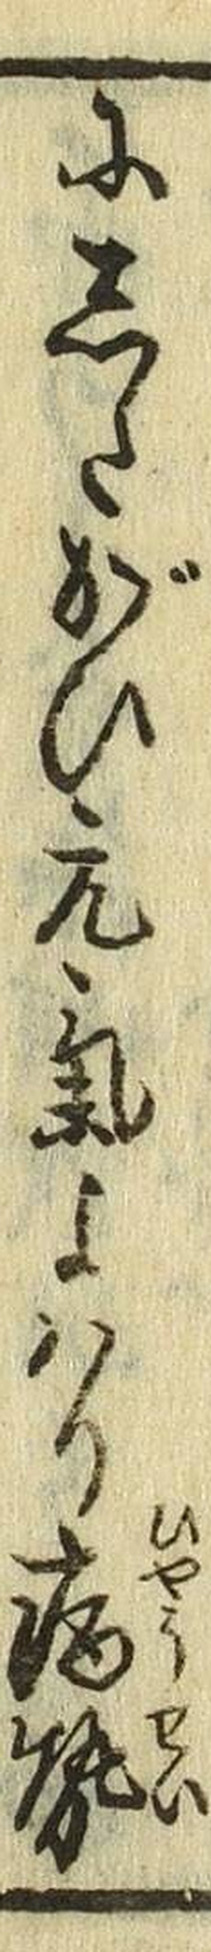にしたがひ元気よはり病勢
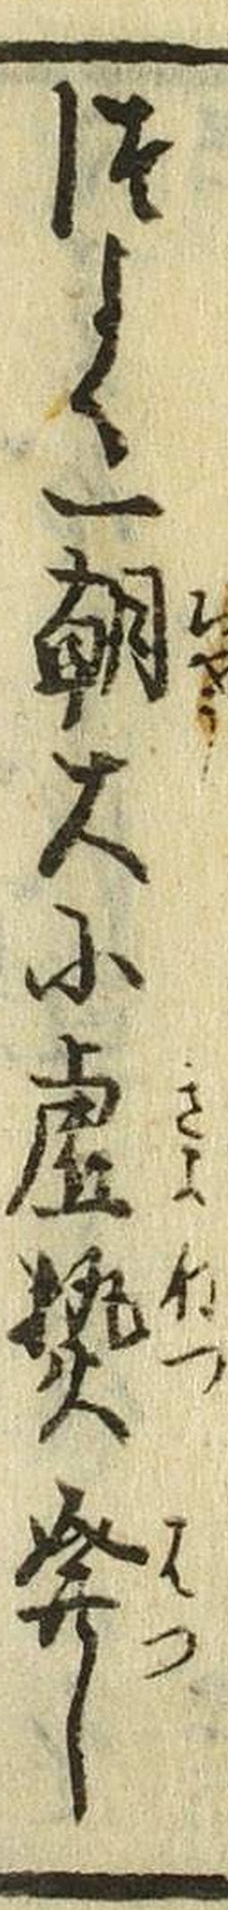つよく一朝大に虚熱発し
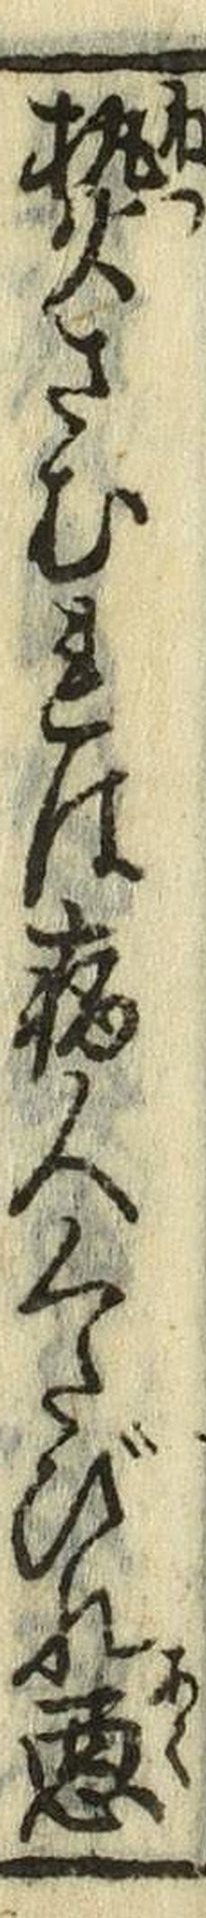熱さむれは病人くたびれ悪
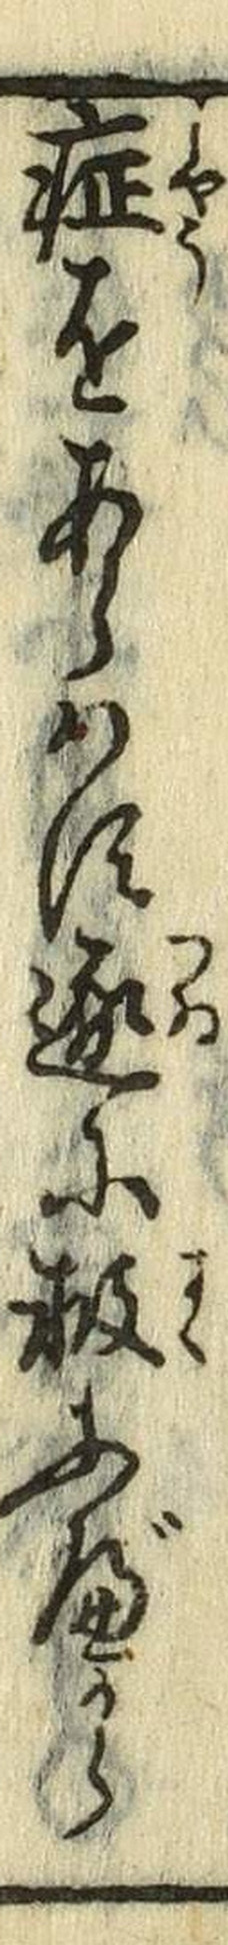症をあらはす遂に救ふべから
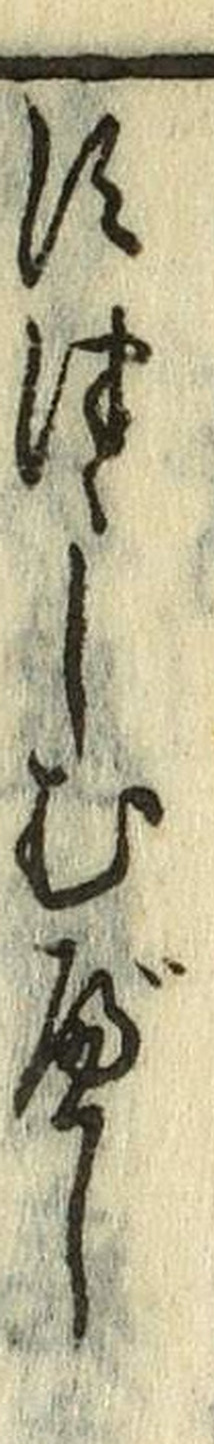すつゝしむべし
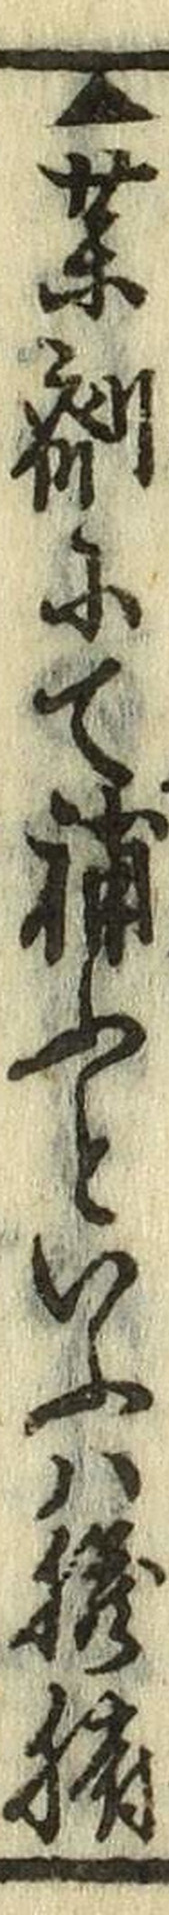▲薬剤にて補ふといふは臓腑
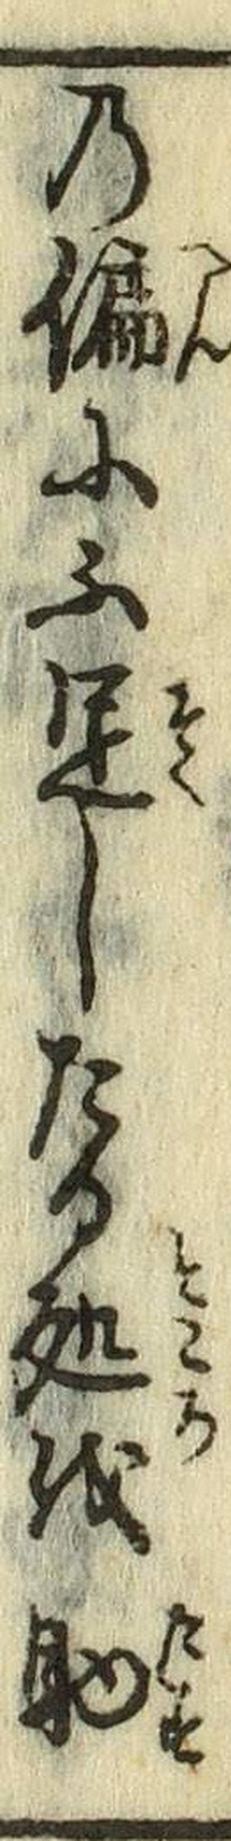の偏に不足したる処を助
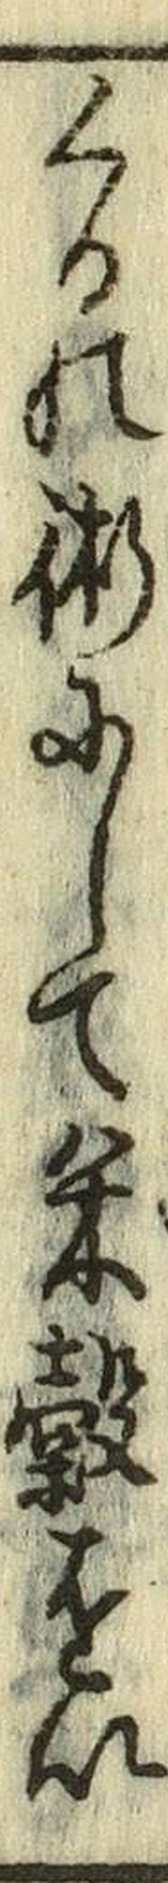くるの術にして米穀を以
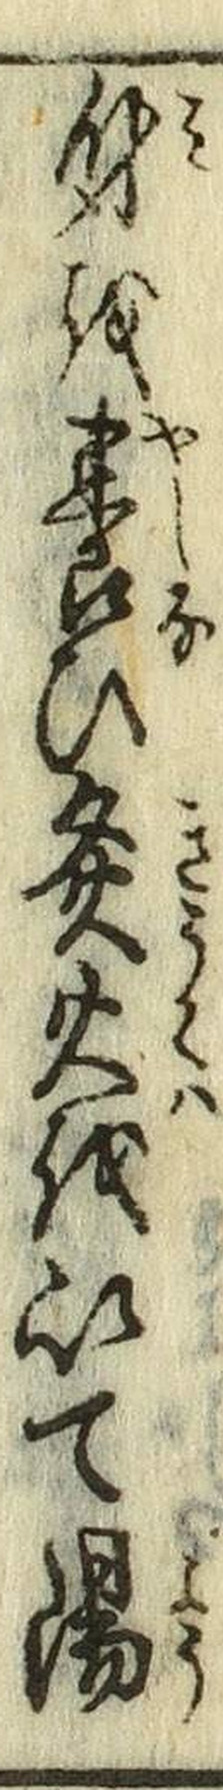身を養ひ灸火を以て陽
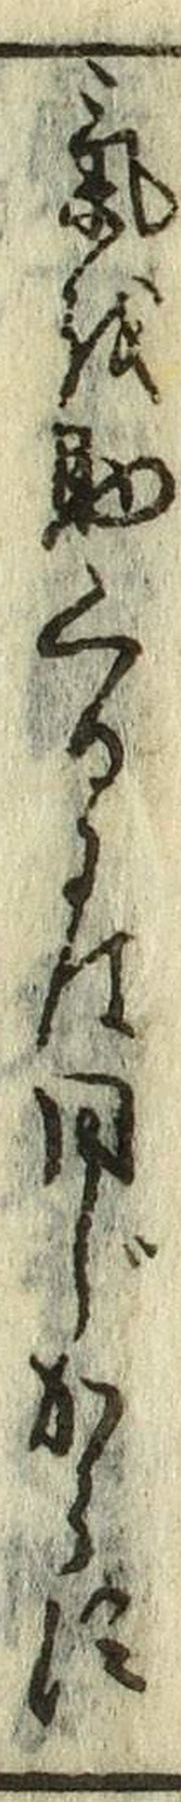気を助くるには同じからす
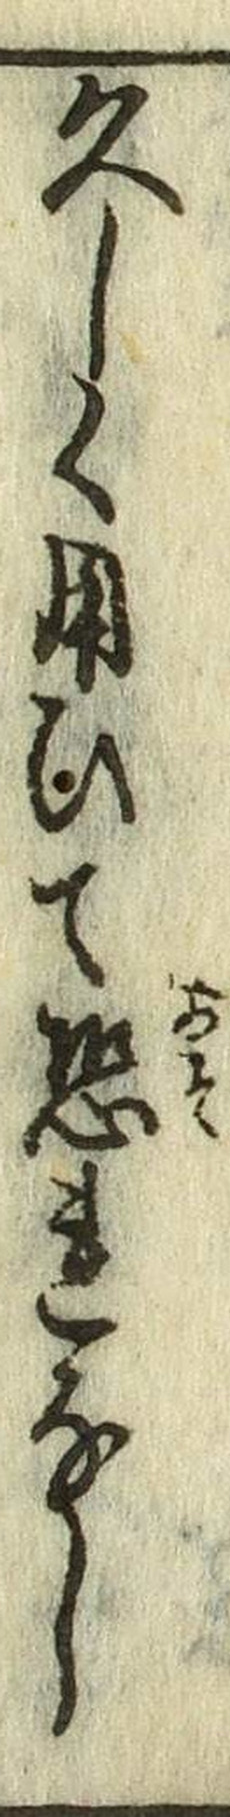久しく用ひて恐れなし
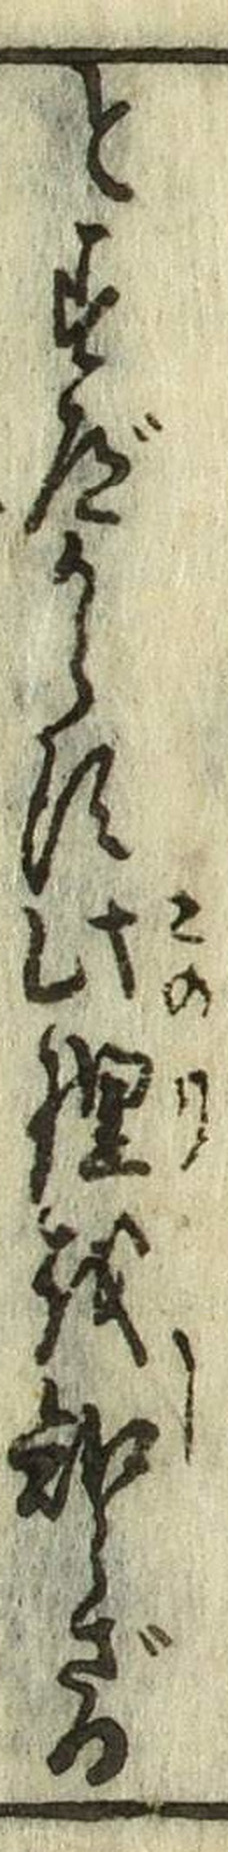とすべからす此理を知らざる
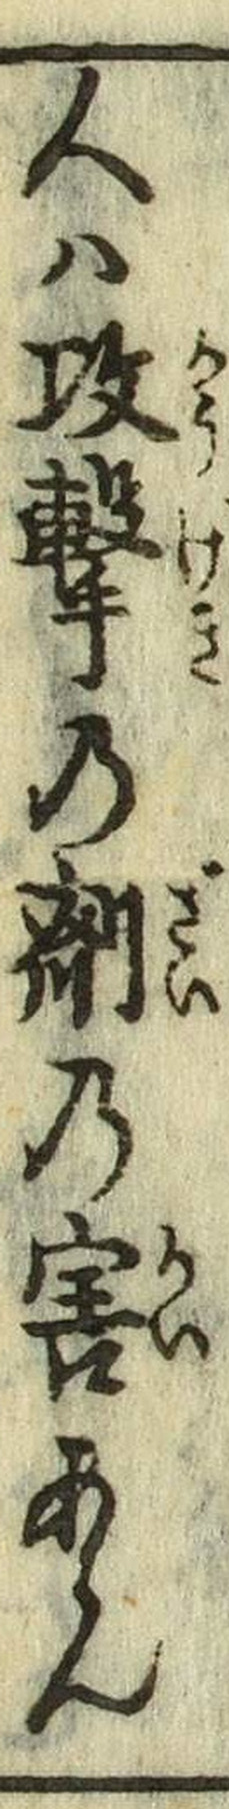人は攻撃の剤の害あらん

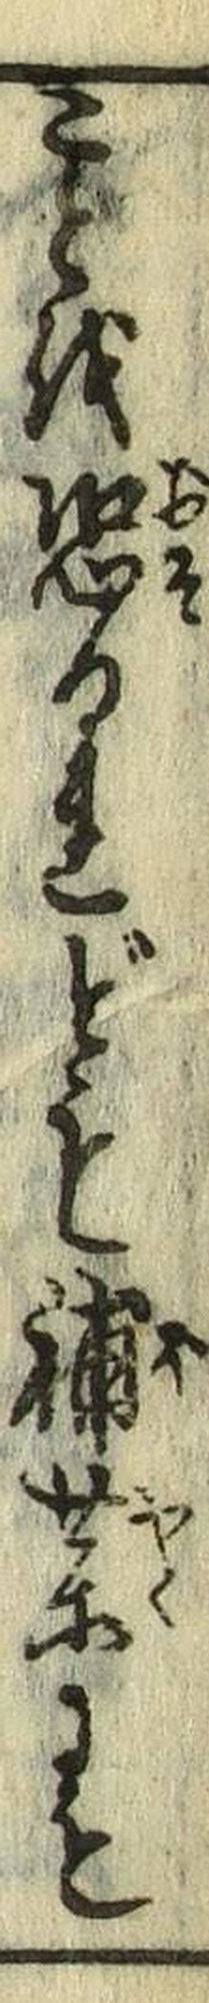ことを恐るれども補薬にも
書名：居家養生記
